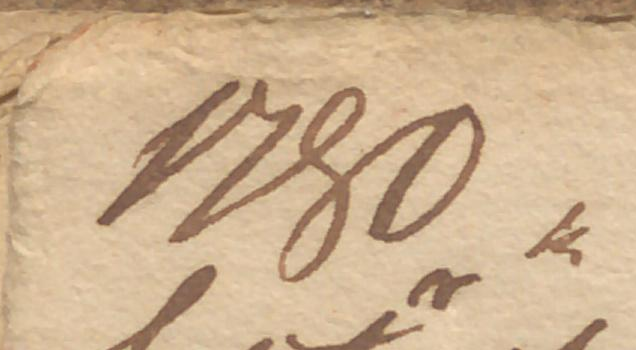1780
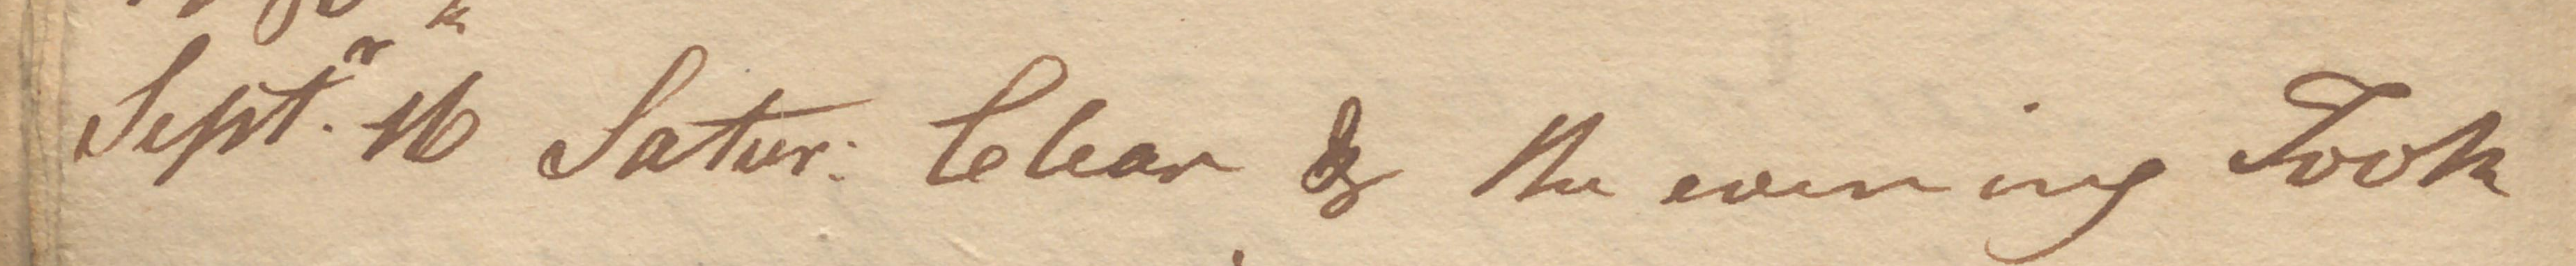Sept^r. 16^th Satur. Clear & the evening Took
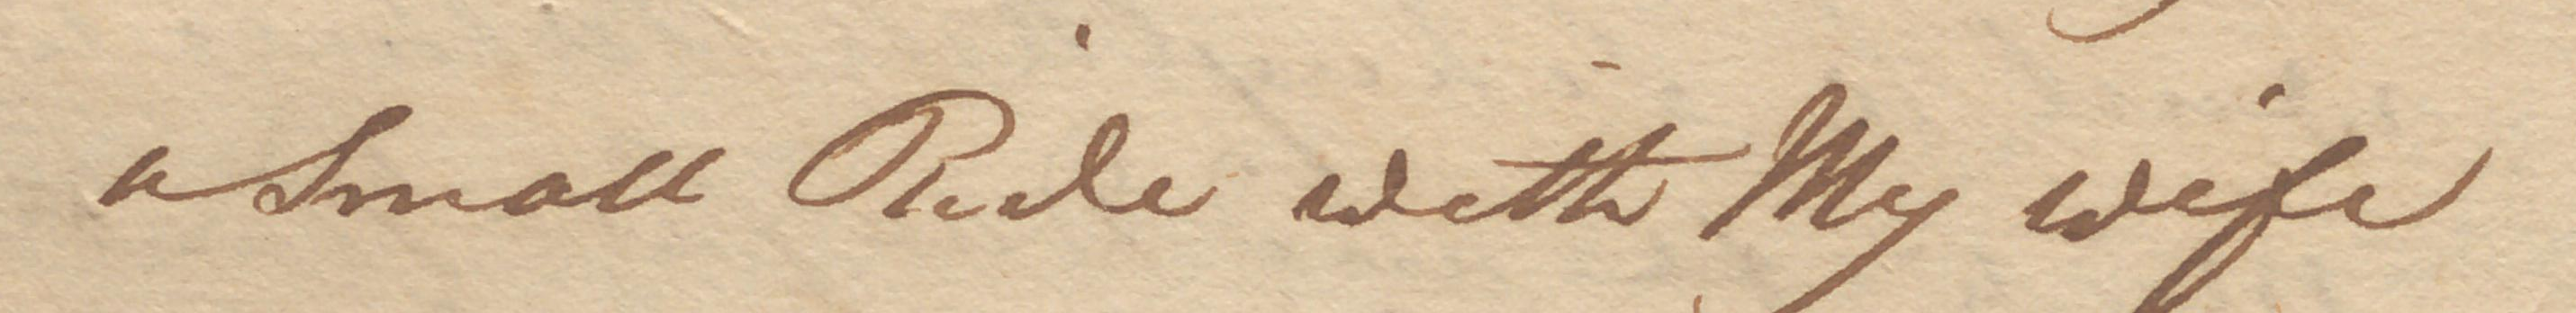a small Ride with My wife
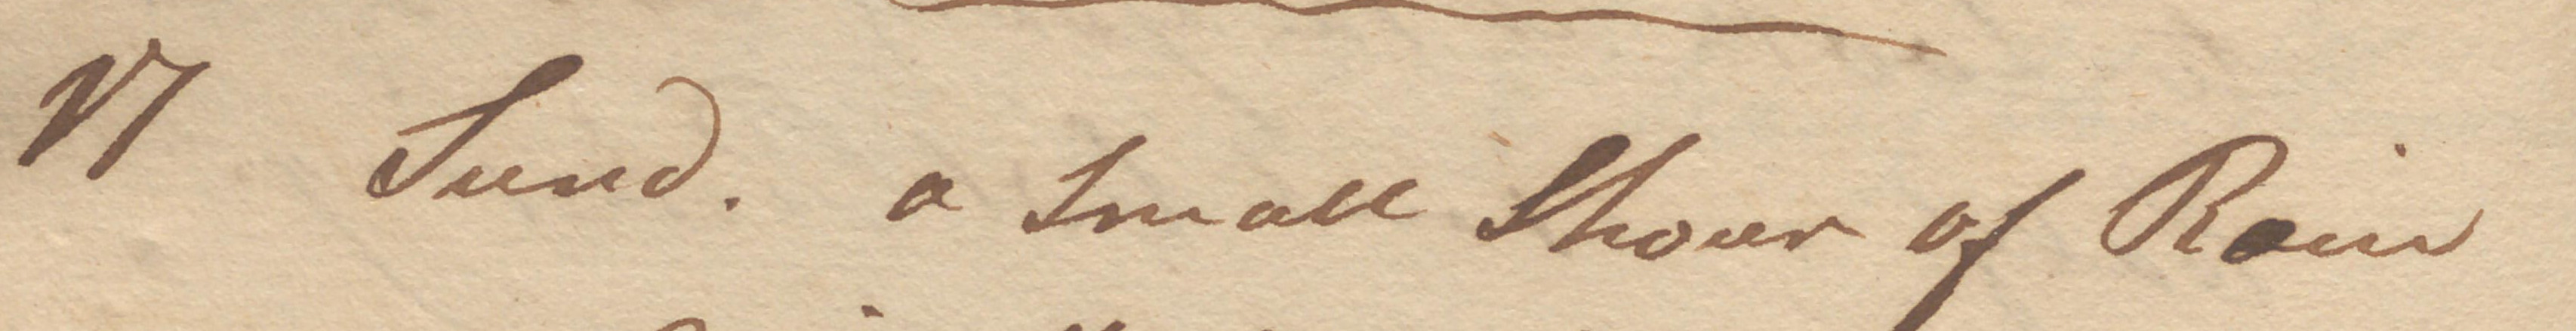17 Sund. a small Shour of Rain
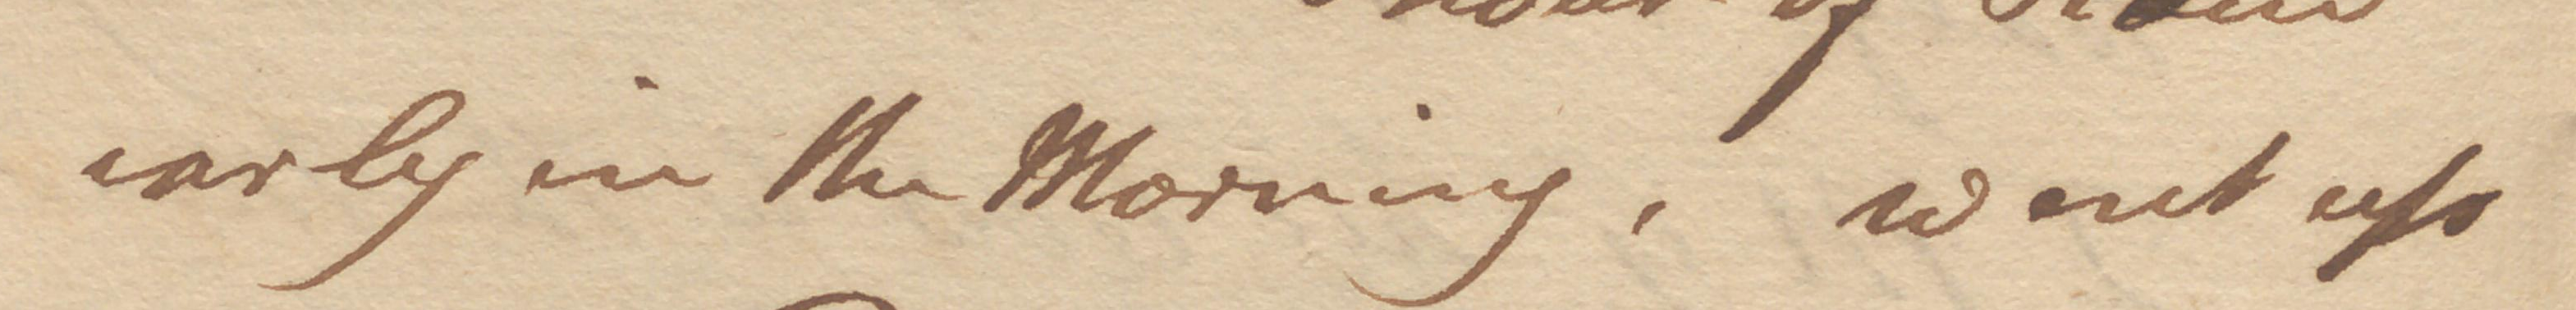early in the Mornig, went up
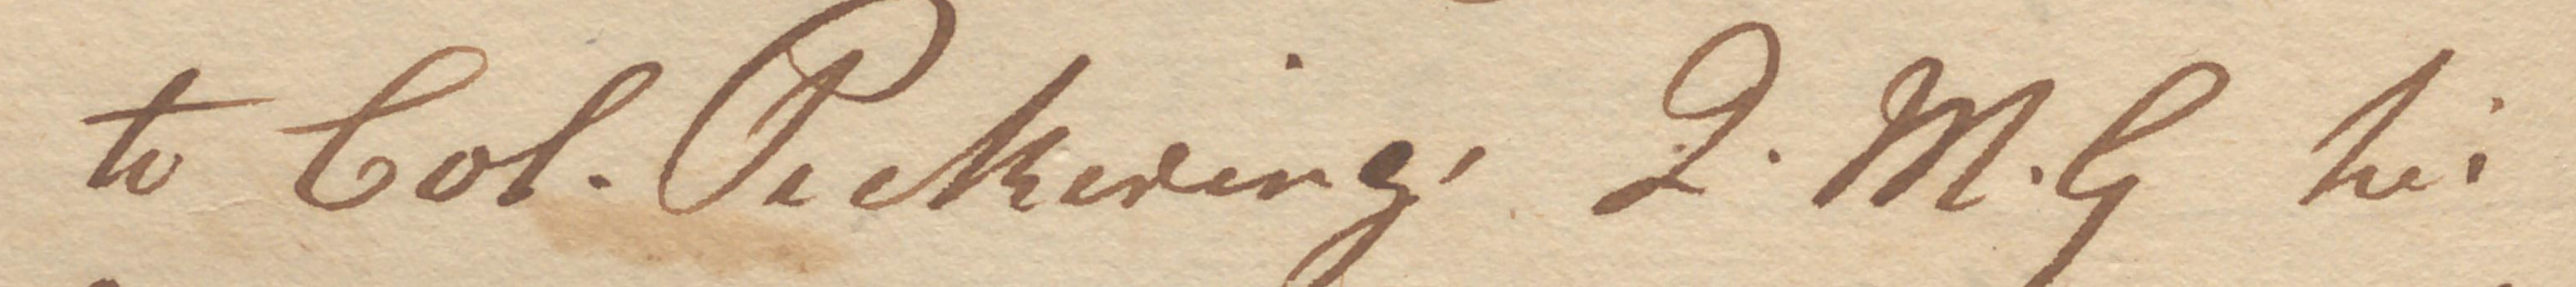to Col. Pickerings Q. MG. his
